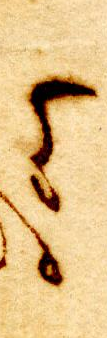To
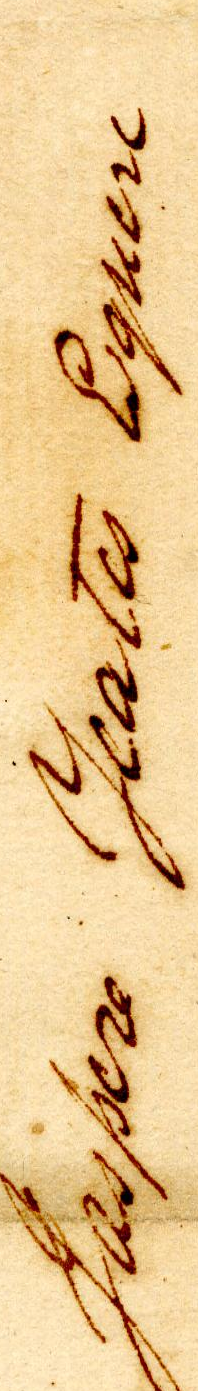Jaspere Yeates Esquire
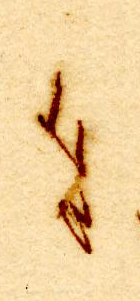at
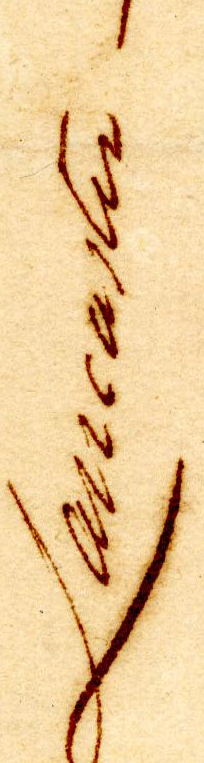Lancaster
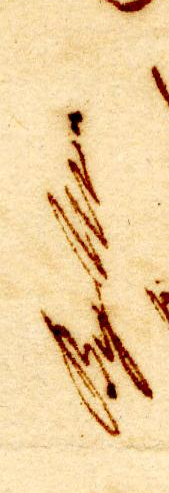By M^r
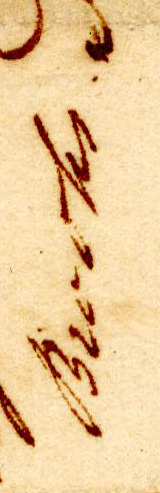Brooks
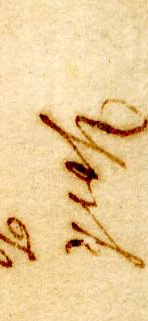York
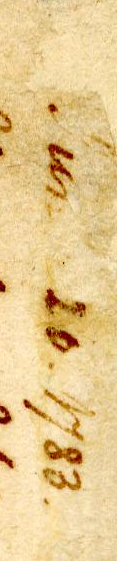June 20. 1783.
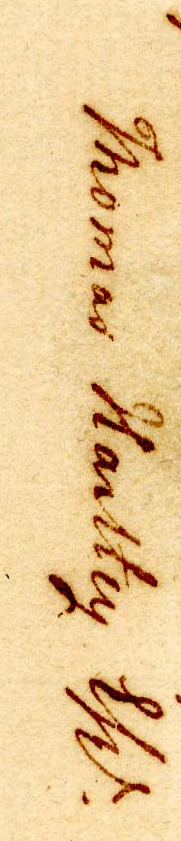Thomas Hartley Esq^r
